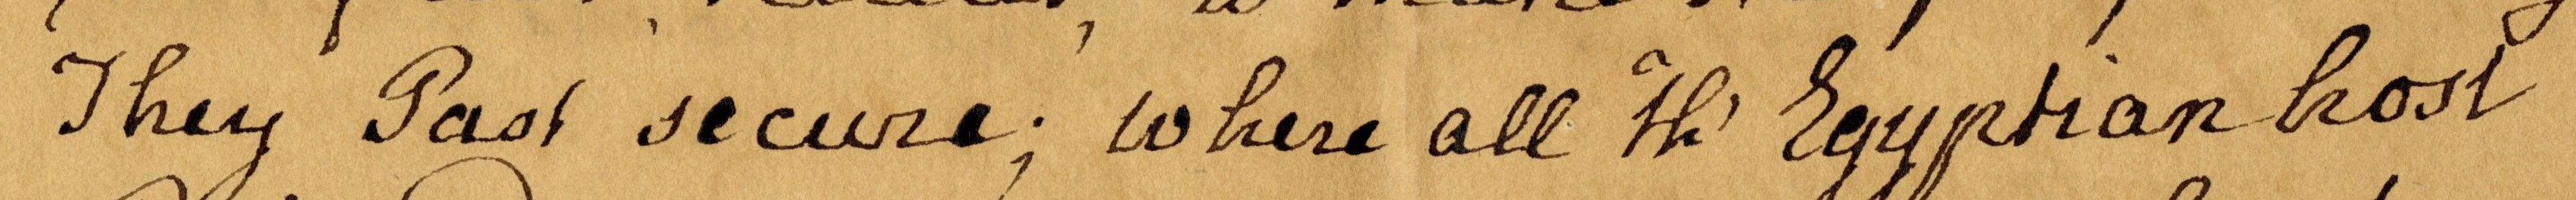They Past secure; where all th' Egyptian host
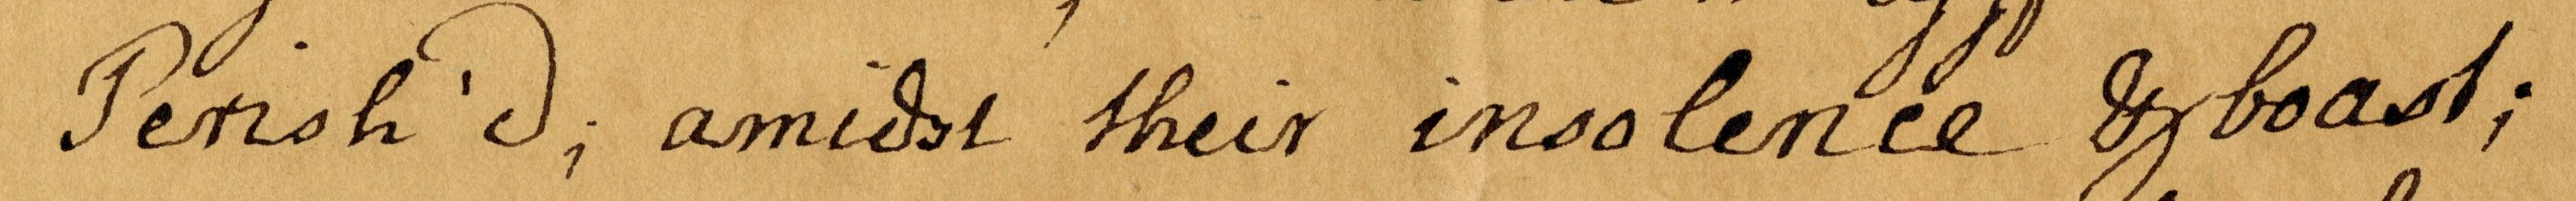Perish'd; amidst their insolence & boast;
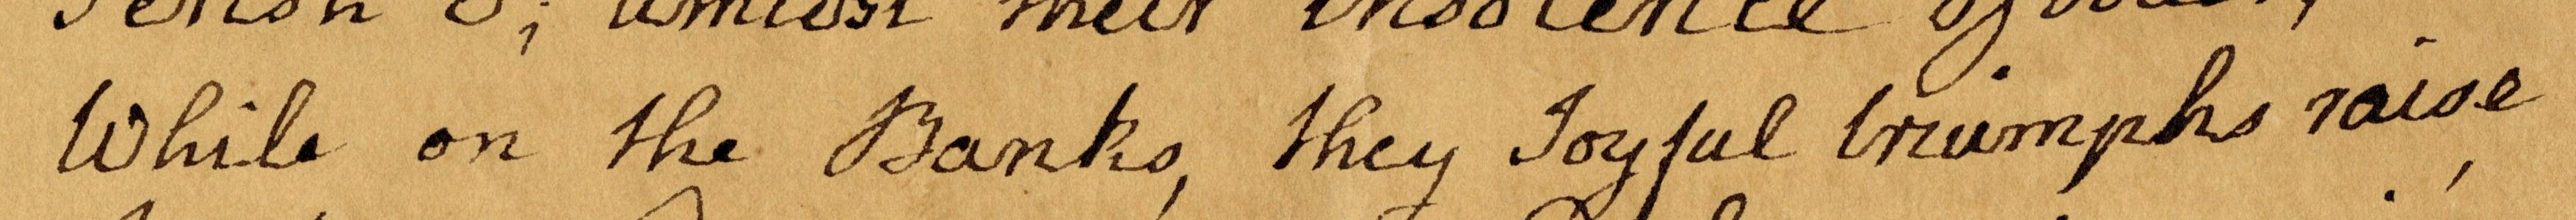While on the Banks, they Joyful triumphs raise
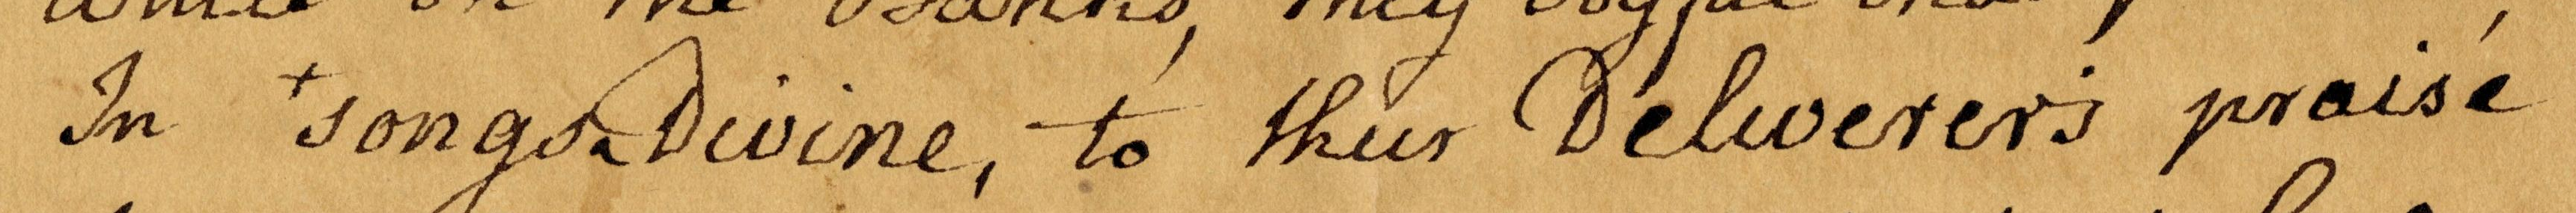In songs Divine, to their Deliverer's praise
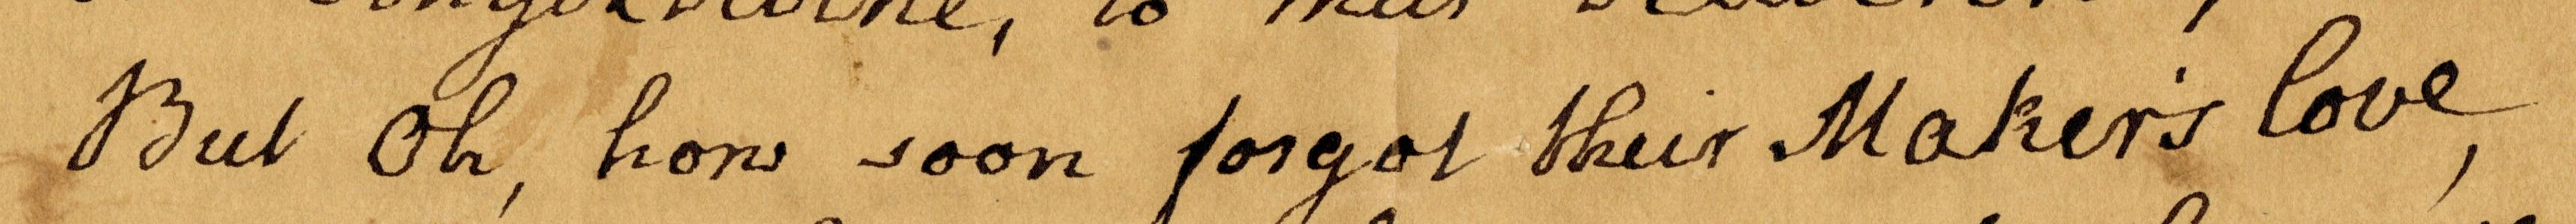But Oh, how soon forgot their Maker's love,
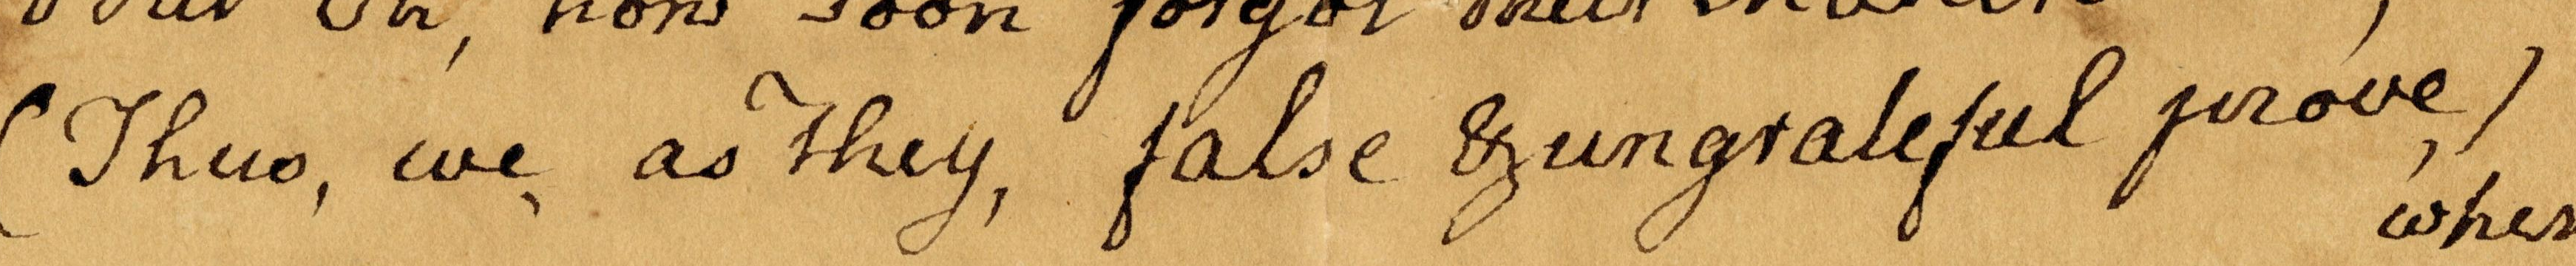(Thus, we, as they, false & ungrateful prove,)
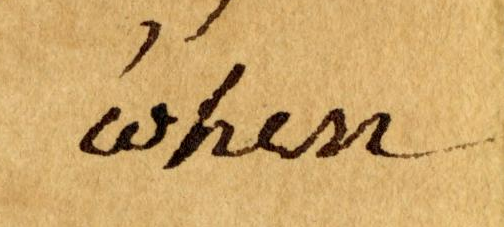when
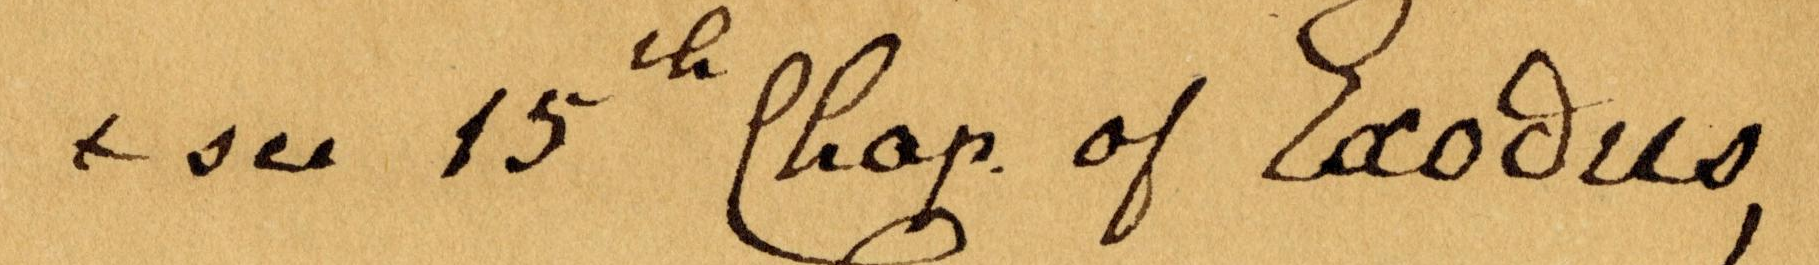& see 15^th Chap. of Exodus,
